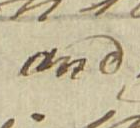and
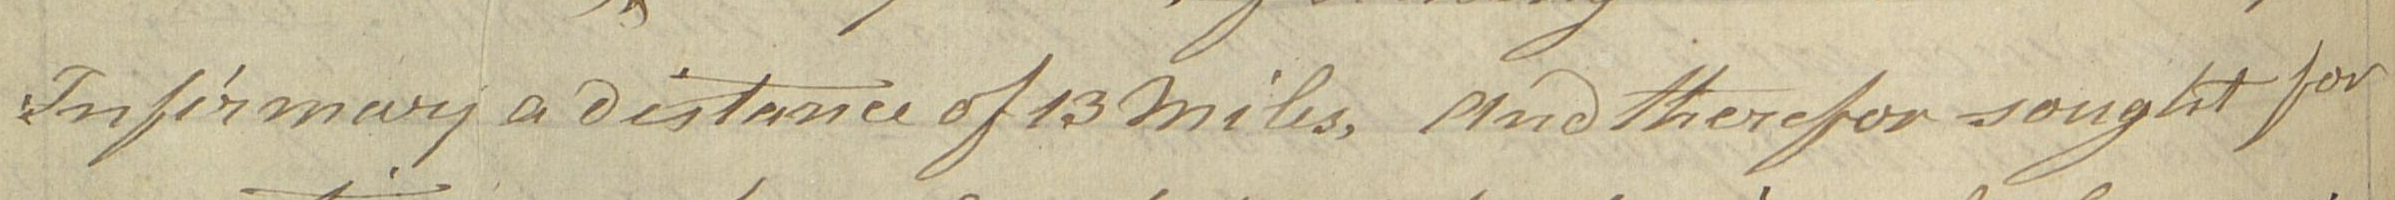Infirmary a distance of 13 Miles, and therefor sought for
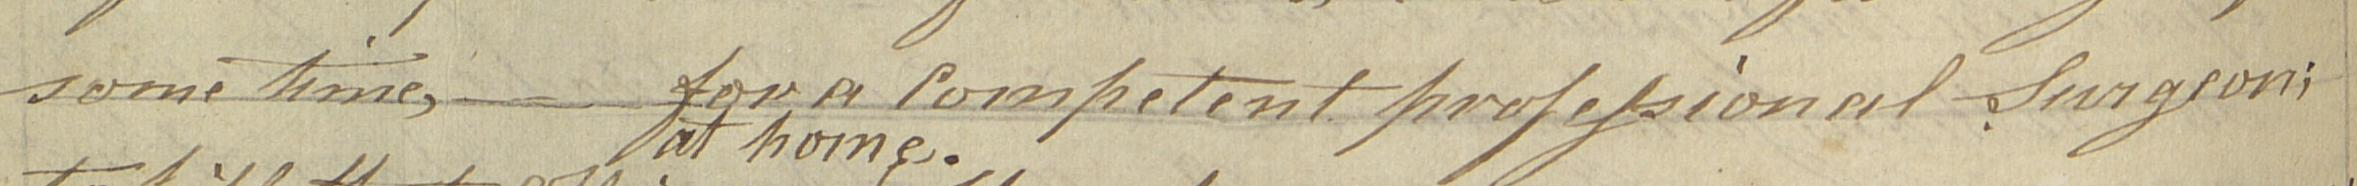some time, for a competent professional Surgeon;
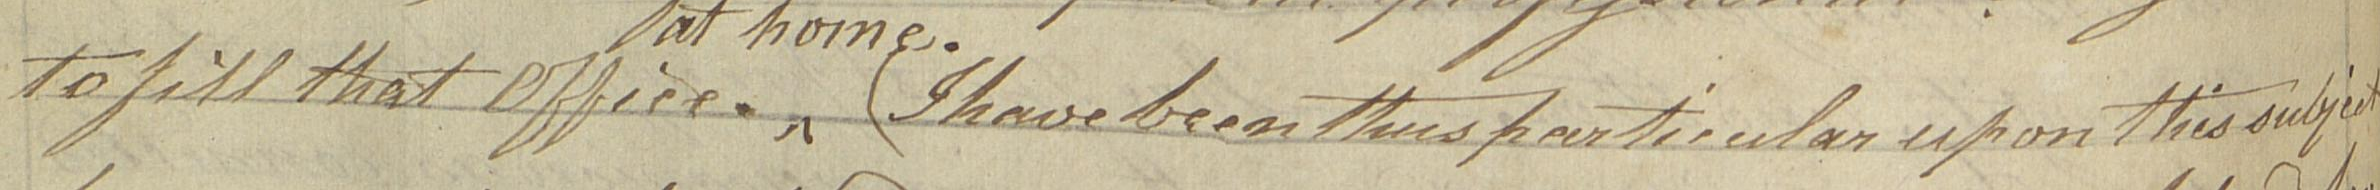to fill that Office. ^ (I have been thus particular upon this subject
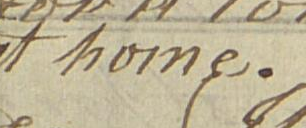at home.
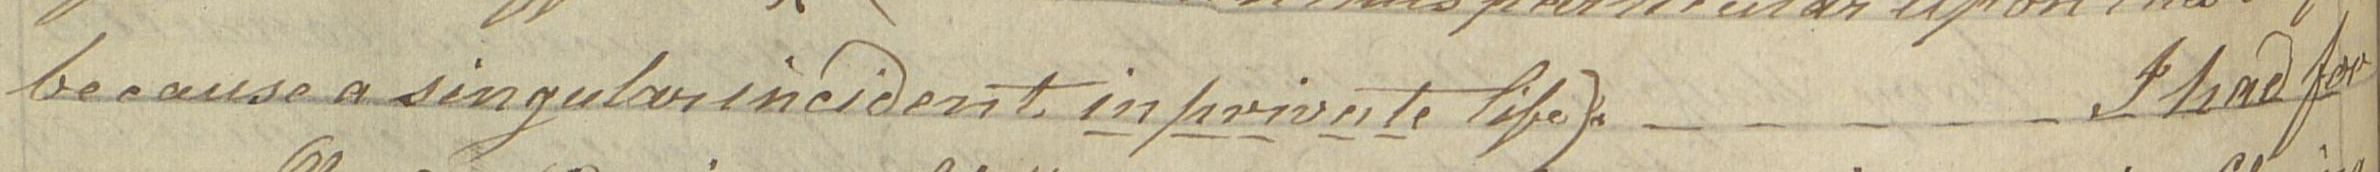because a singular incident in private life). I had for
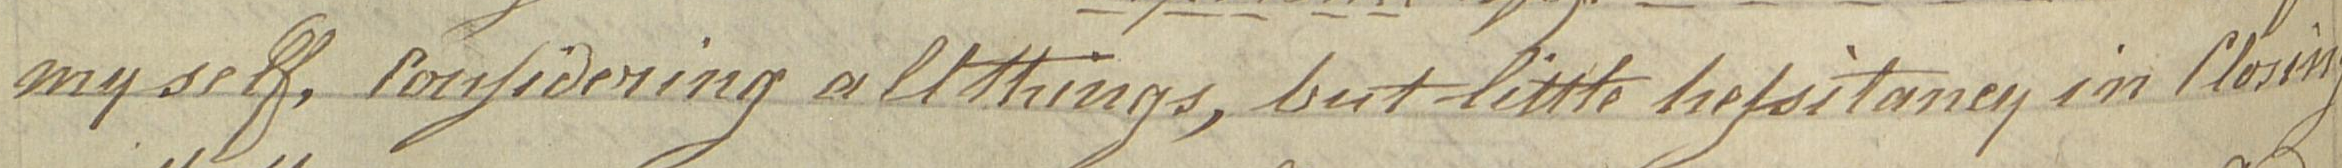my self, considering all things, but little hesitancy in Closing
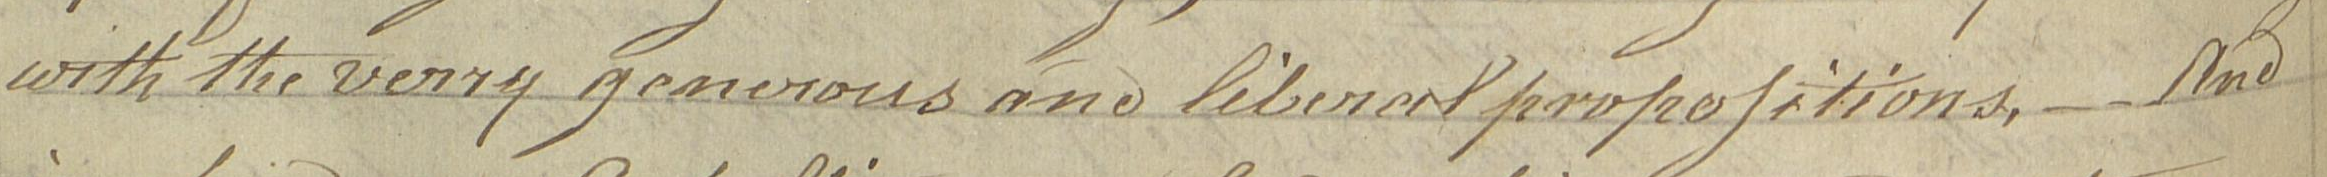with the verry Generous and liberal propositions, And
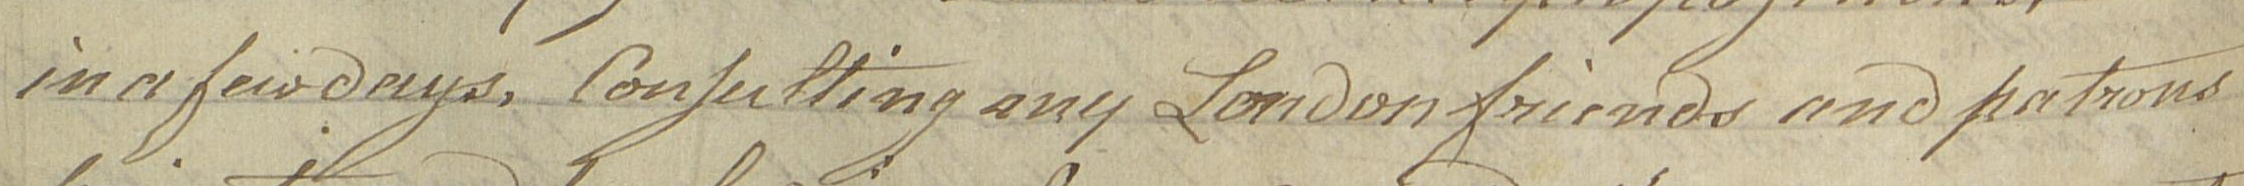in a few days, Consulting any London friends and patrons
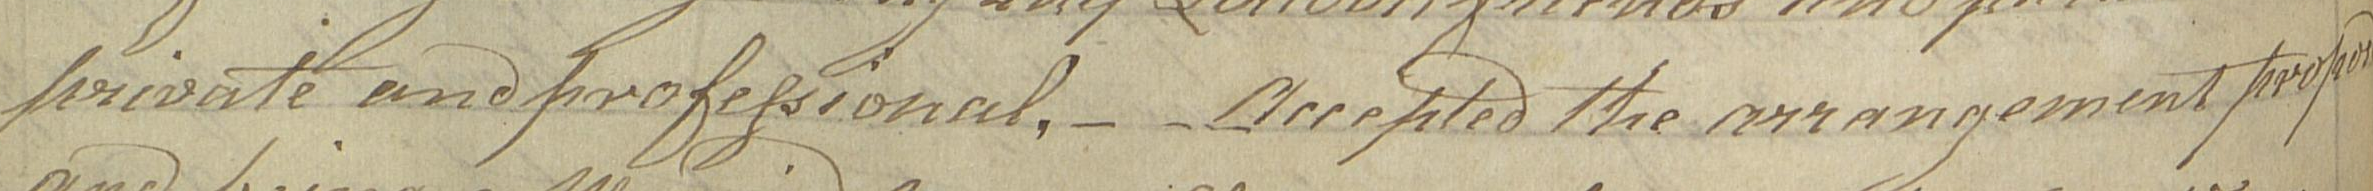private and professional, Accepted the management proposed
